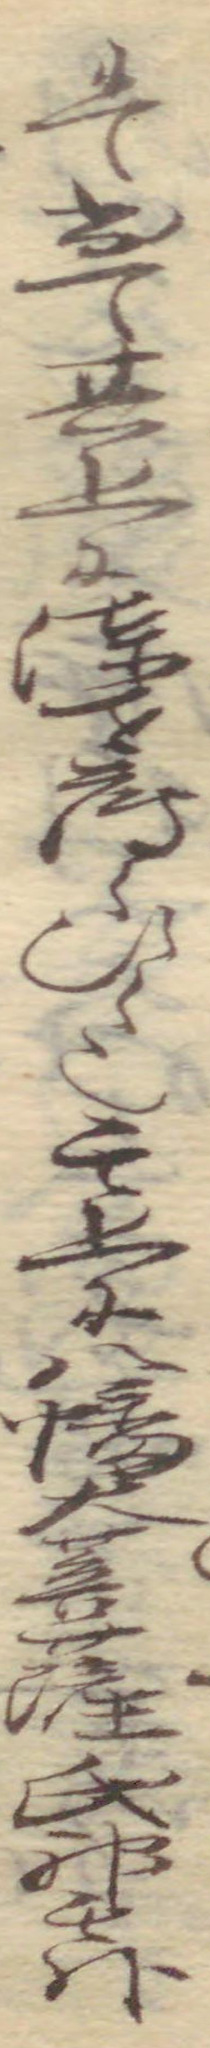にて書て其上に漆を薄くひく也其上にハ八幡大菩薩氏神其外
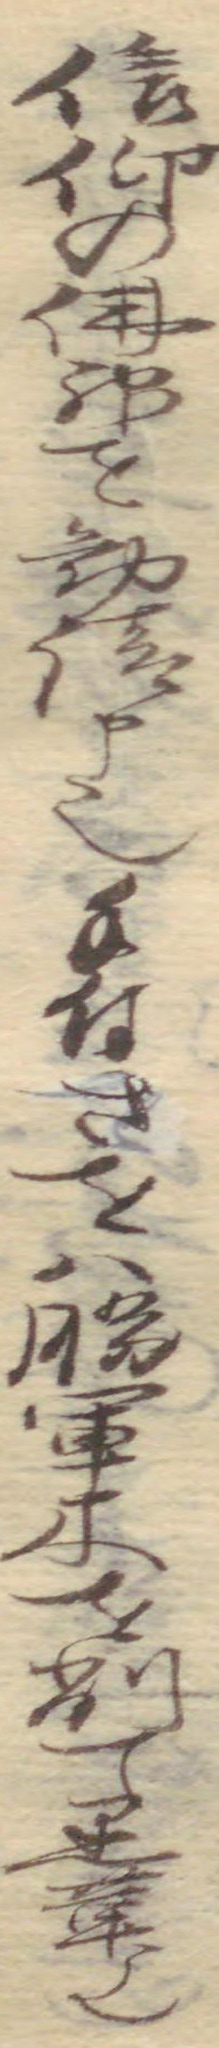信仰の佛神を勧請申也手付さをハ勝軍木を削て黒革ニて
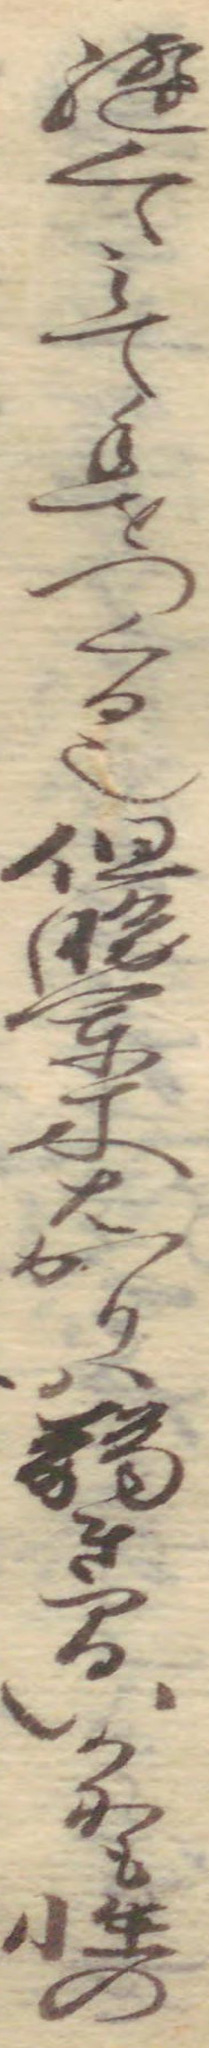縫くゝミて手をつくる也但勝軍木はかりハ弱き間いかにも性の
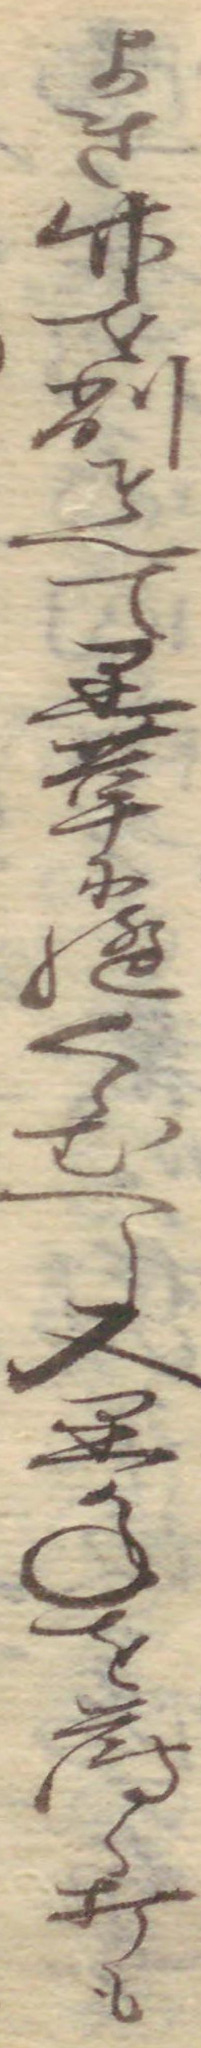よき竹を削そへて黒革に縫くゝむへし又黒かねを薄く打も
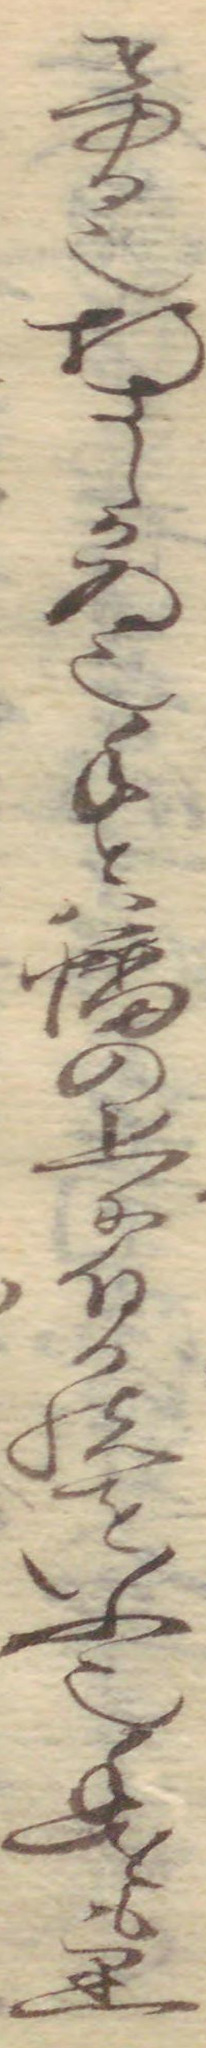そゆる也折さしか為也手とハ幡の上に付る緒をいふ也手をも黒
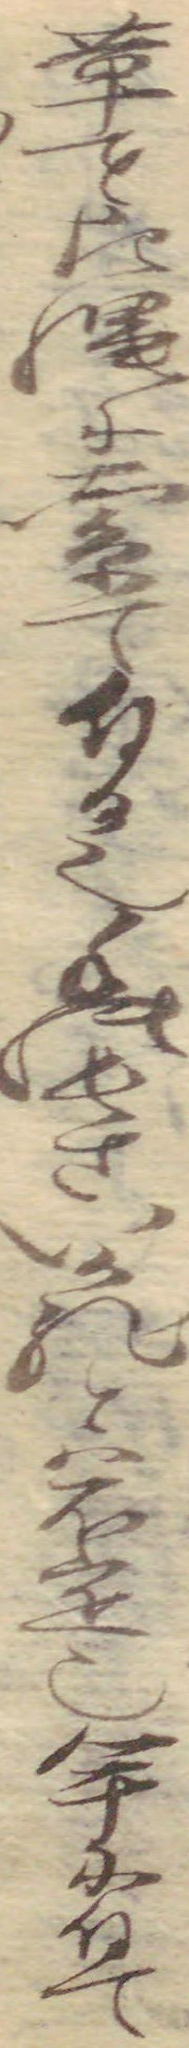革を左縄に索て付る也手の長さいか程とハ不定也竿に付て
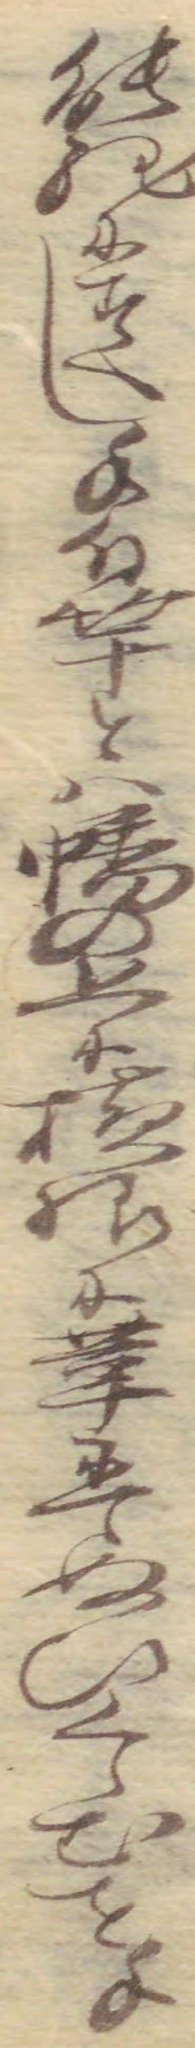能程にすへし手付竿とハ幡の上に横様に革にてぬひくゝむを手

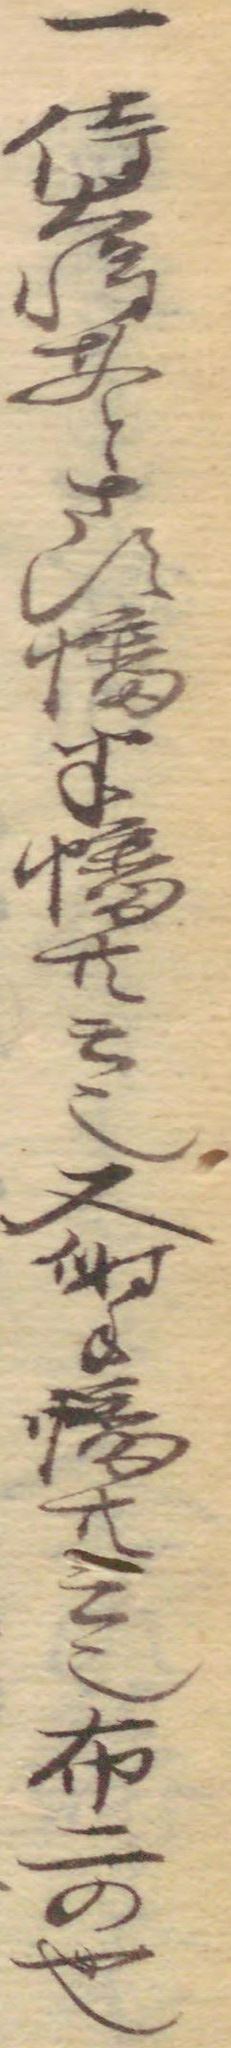一侍大将なとさす幡半幡共云也又射手幡共云也布二の也
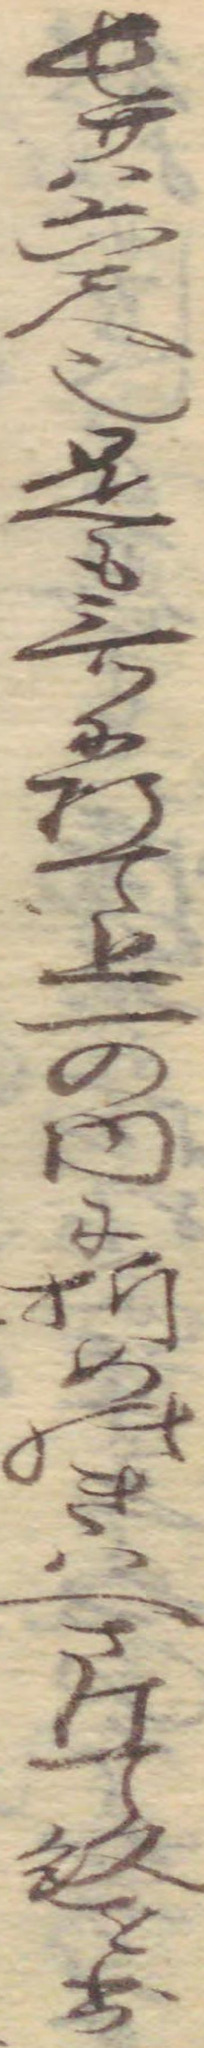長サハ六尺也是も三ツに折て上一の内に折めのきハへさけて紋を書
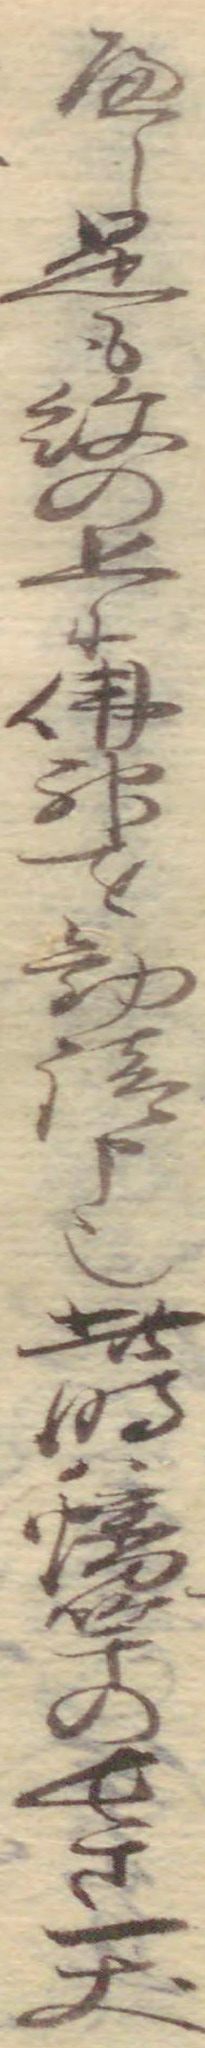へし是も紋の上に佛神を勧請申也此時ハ幡竿の長さ一丈
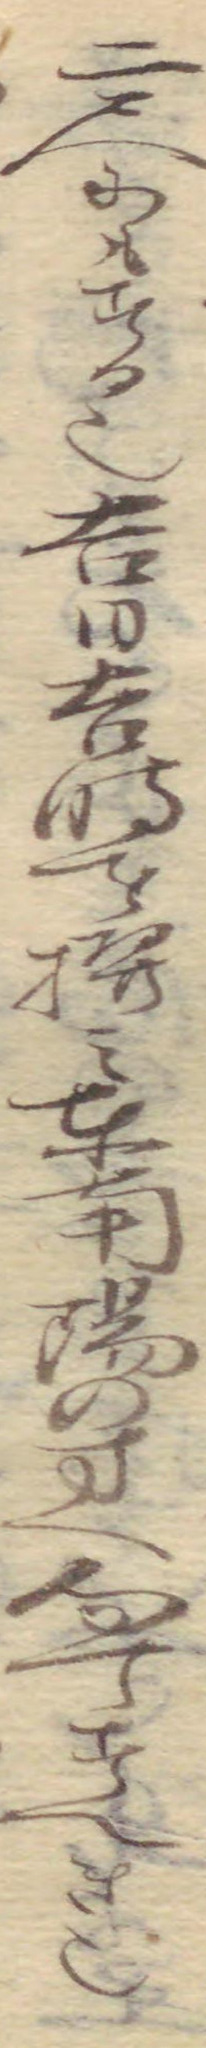二尺にもする也吉日吉時を撰ミ東南陽の方へ向てすへき也
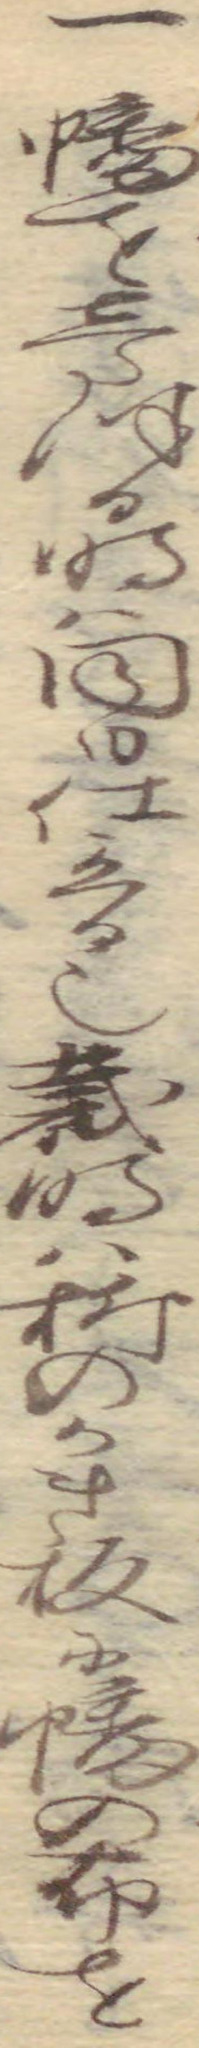一幡をしたつる時ハ同日仕立る也裁時ハ柳のかき板に幡の布を
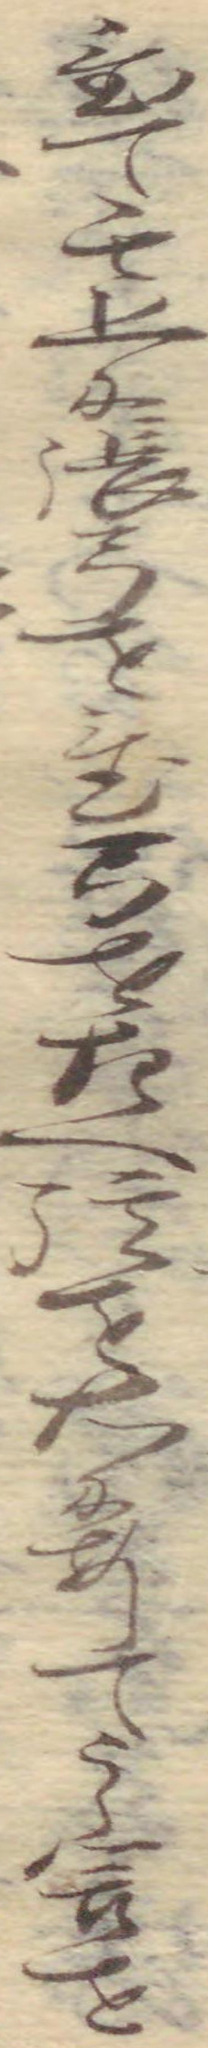置て其上に張弓を置弓を左へ弦を右になしてうら筈を
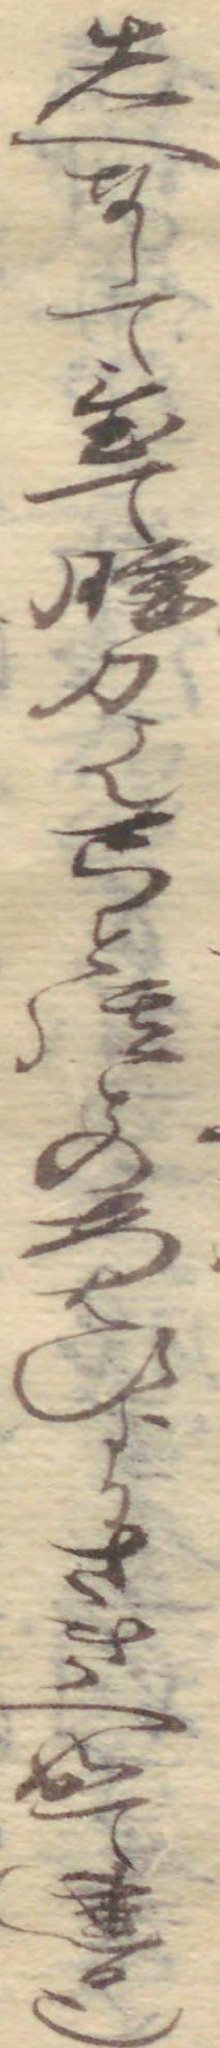先へなして置て腰刀ニて弓と弦とのあはひよりさきへ成て建る也
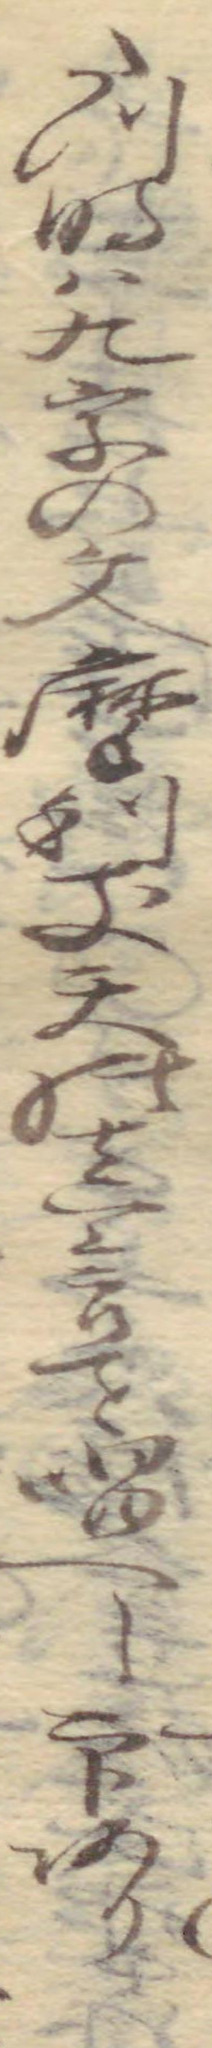たつ時ハ九字の文摩利支天の眞言を唱へし印あり
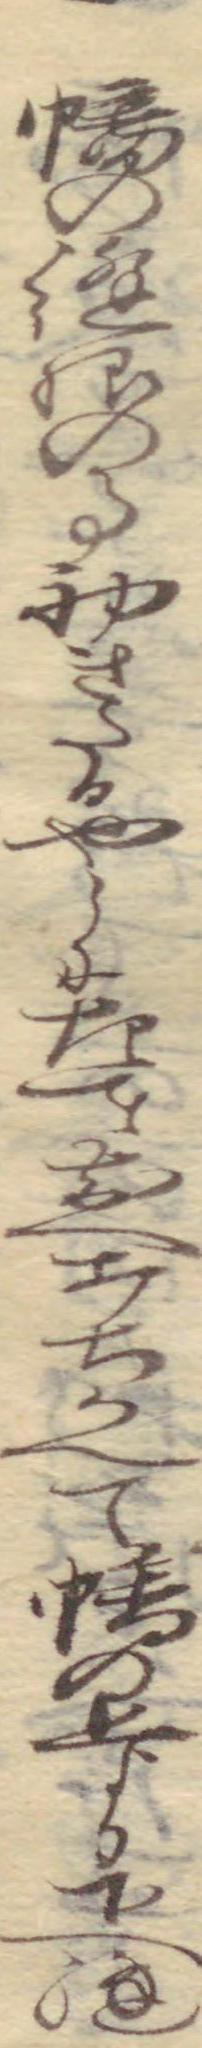一幡の縫様の事初きたるやうに左を前へ打ちかへて幡の上より下へ縫
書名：鶯宿雑記. 巻199-200
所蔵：国立国会図書館 National Diet Library, JAPAN
